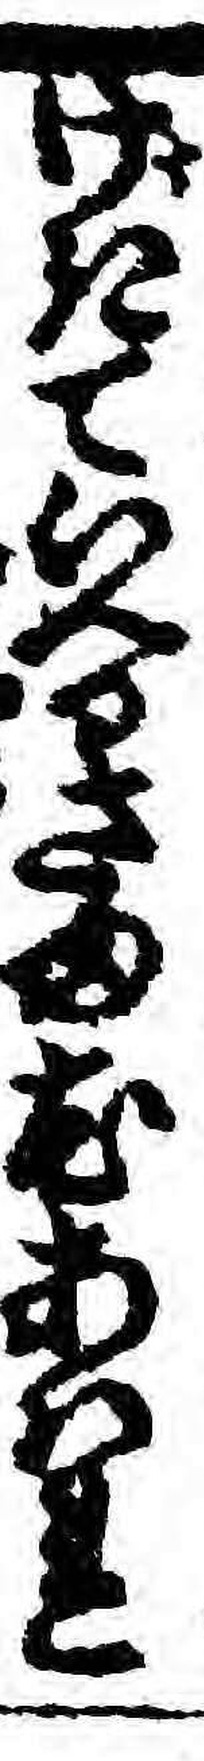げきていへるさま尤あはれ
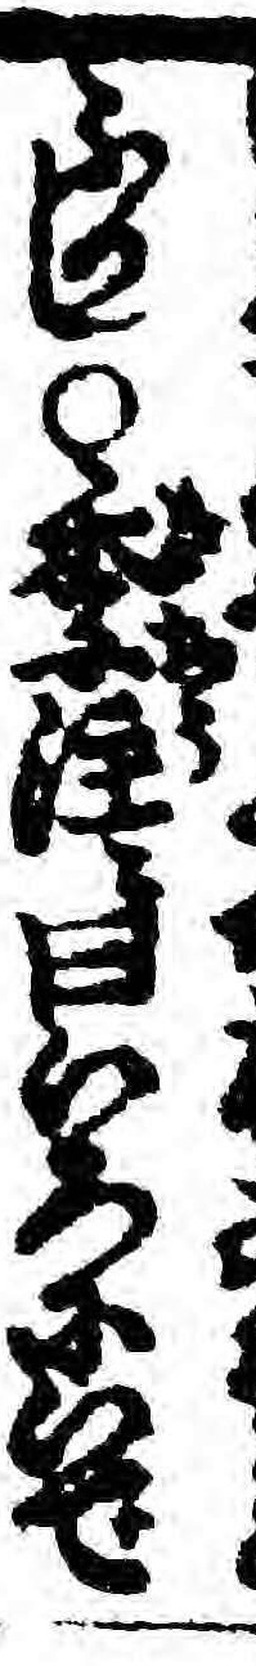ふかし〇季注に曰いろにいで
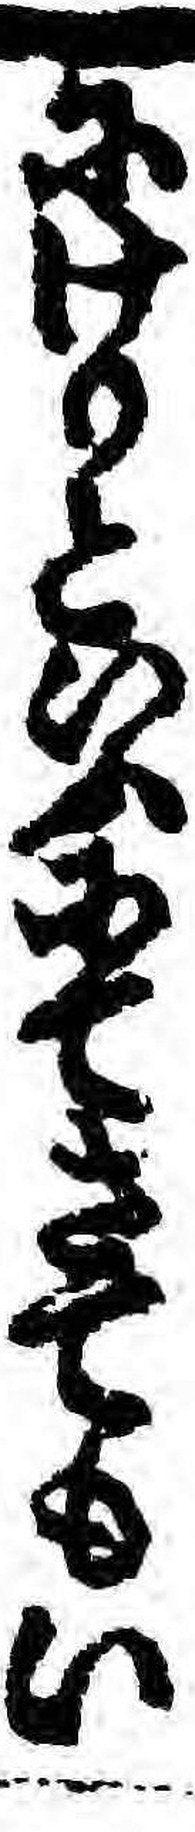にけりといふにてさてもい
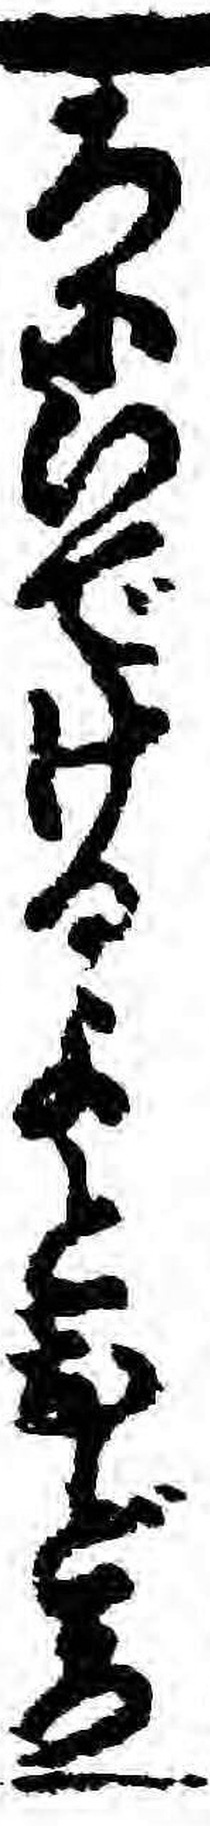ろにいでけるよとおどろ
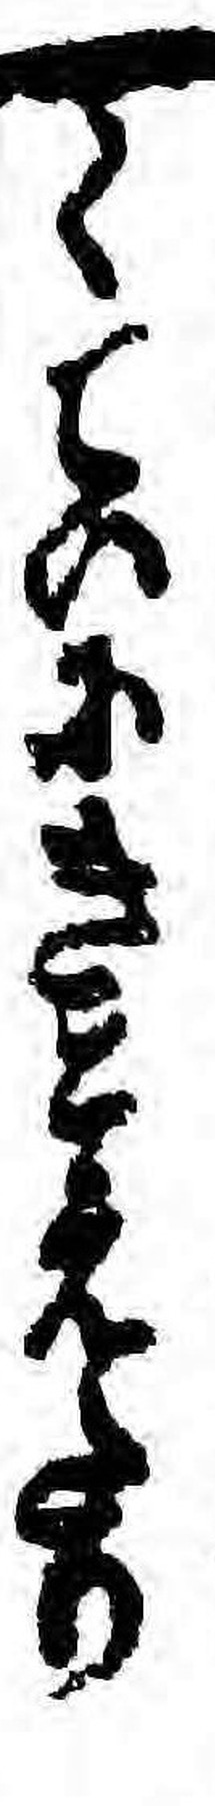くていにきこえたり
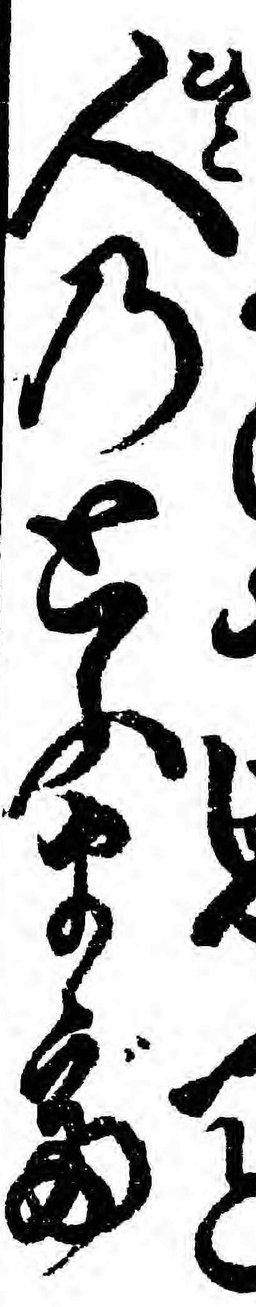人のとふまで
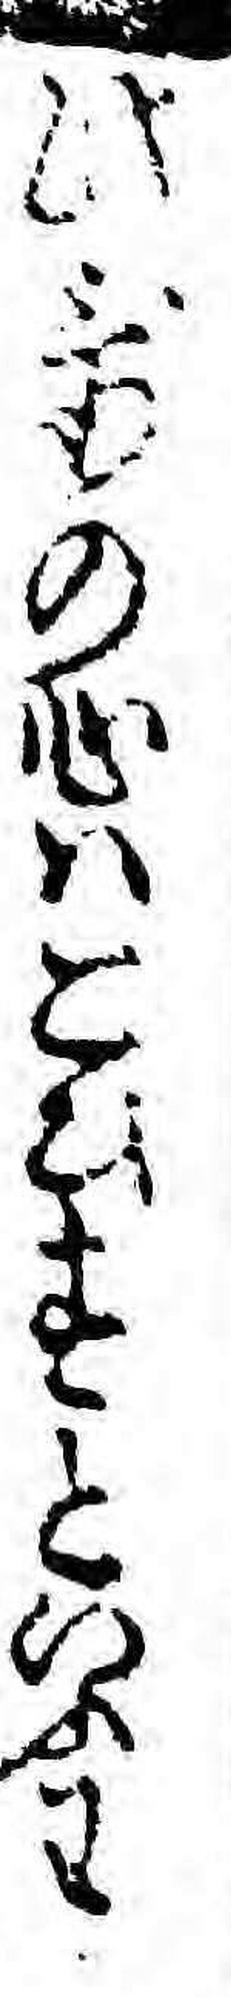此哥の心はこひすといふわ
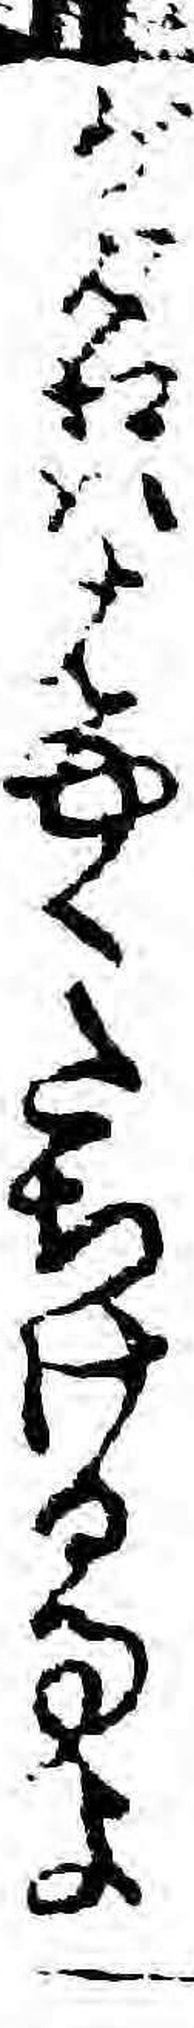が名ははやくたちける事よ
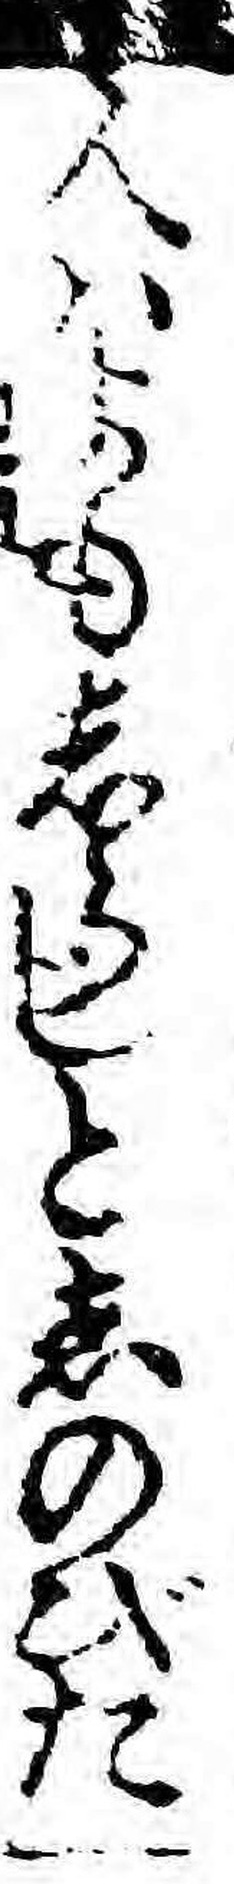人はよもしらじとしのびた
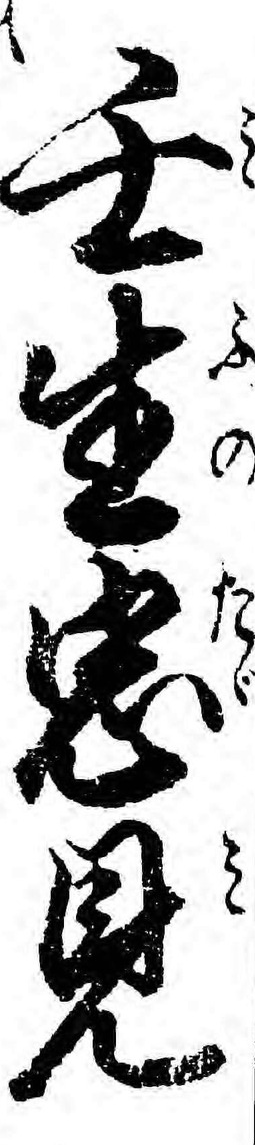壬生忠見
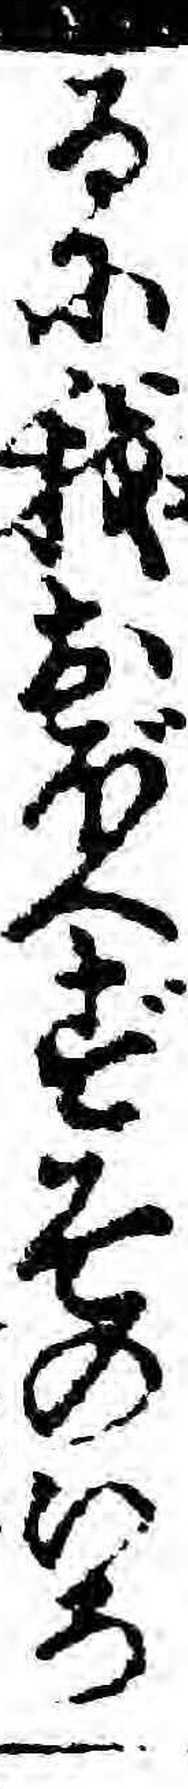るに我おぼへずそのいろ
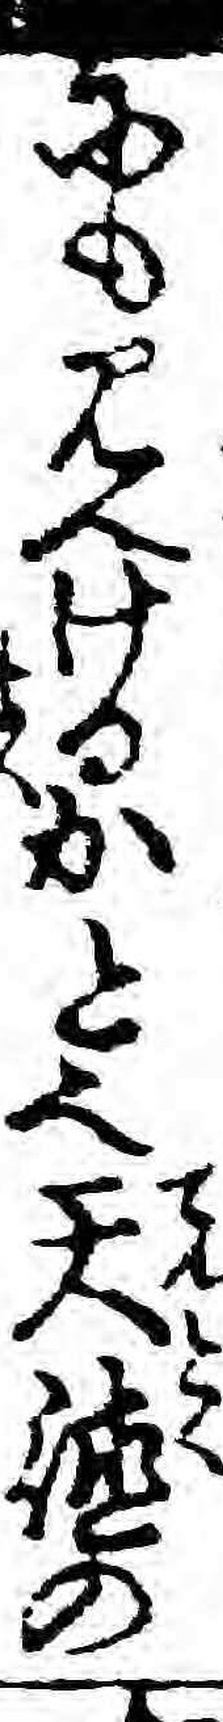にも見へけるかと也天徳の
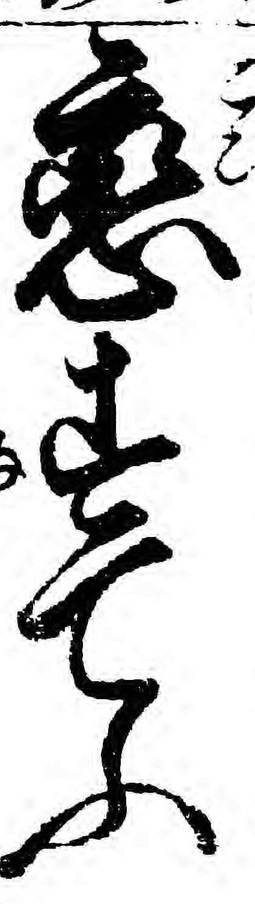恋すてふ
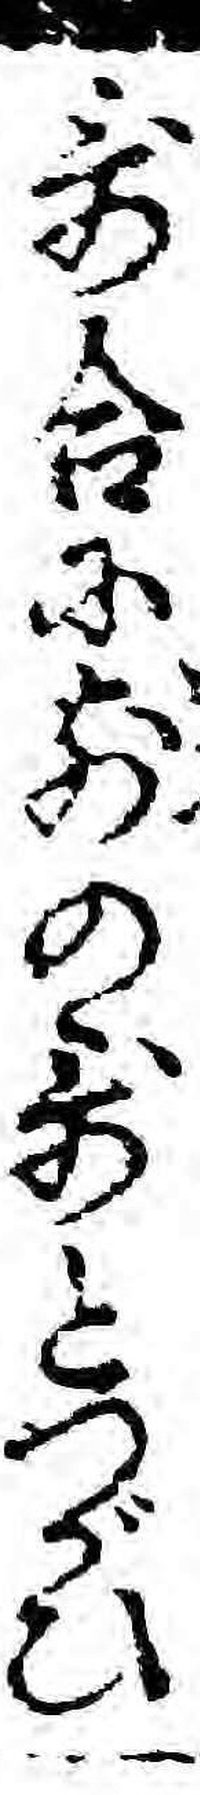哥合に前の哥とつがひ
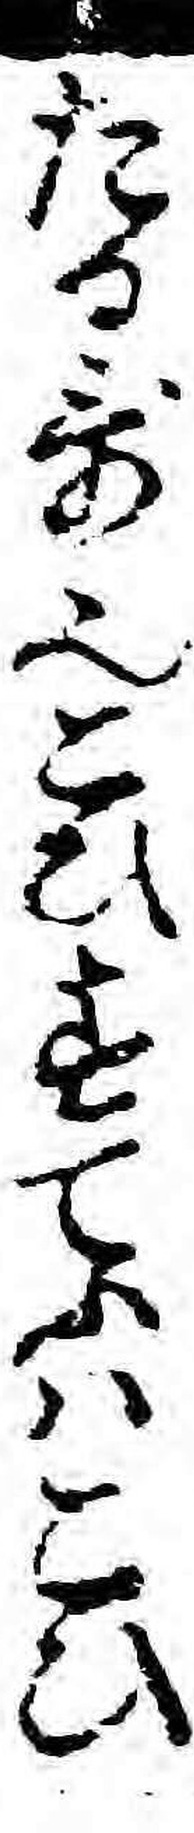たる哥也こひすてふはこひ
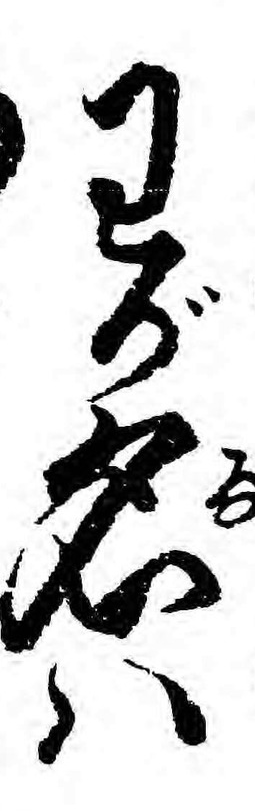わが名は
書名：頭書和歌注譯／壽賀多百人一首小倉錦
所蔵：国文学研究資料館
